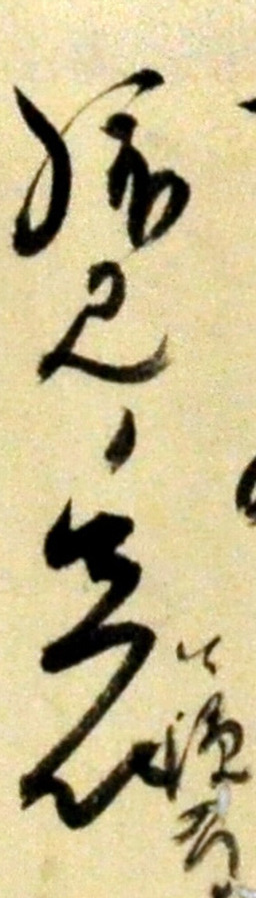拝見候先以
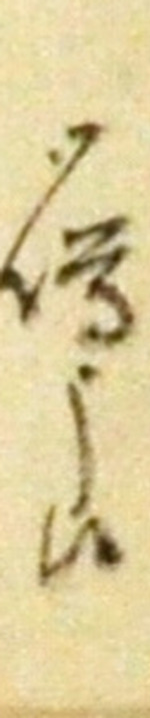御噂申候
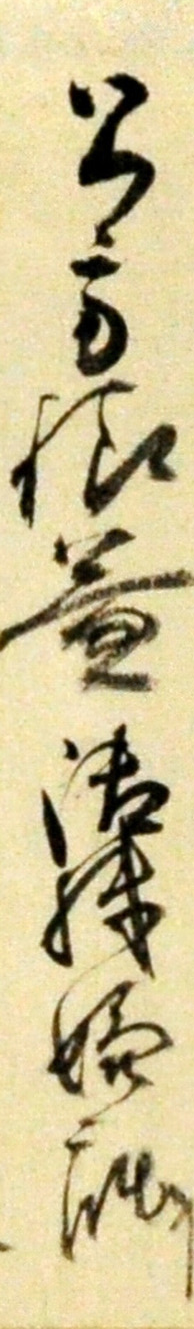公方様益御機嫌能
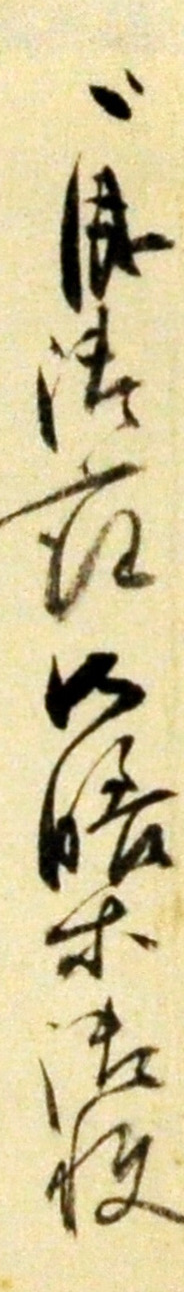被成御座御膳等御快
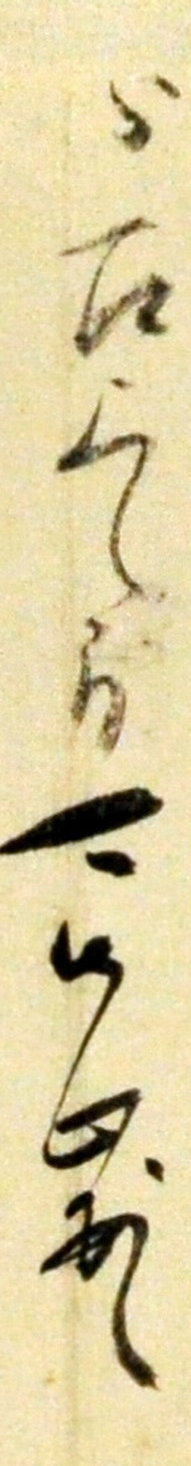被召上候間可御心安候
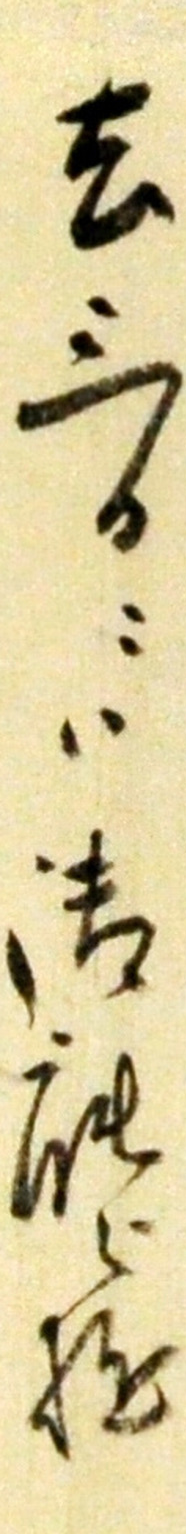去三日には御能被遊
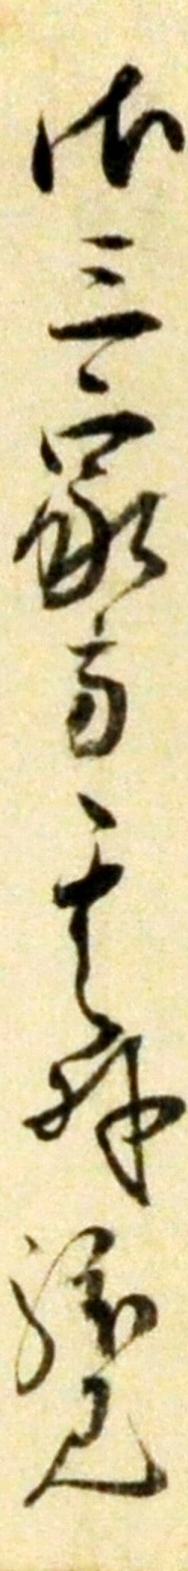御三家方其外拝見
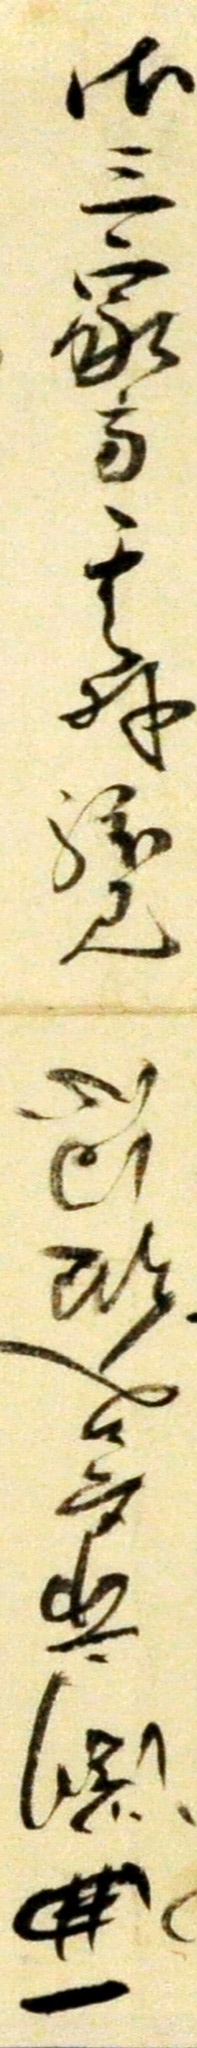御三家方其外拝見
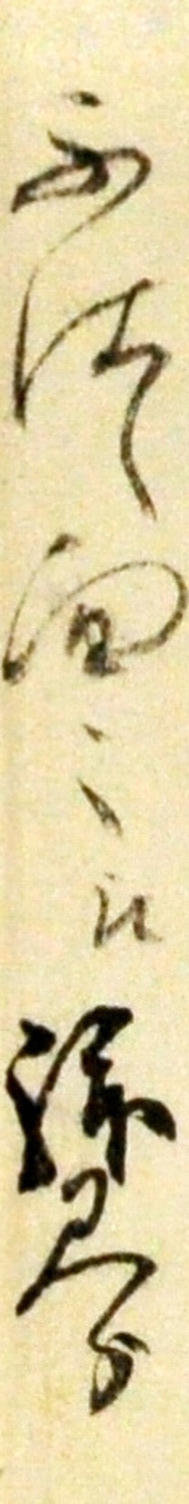不仕候面々江拝見被
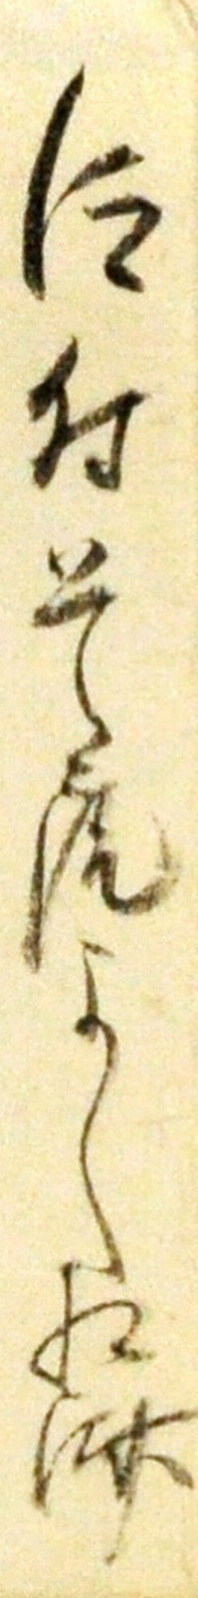仰付首尾よく相済
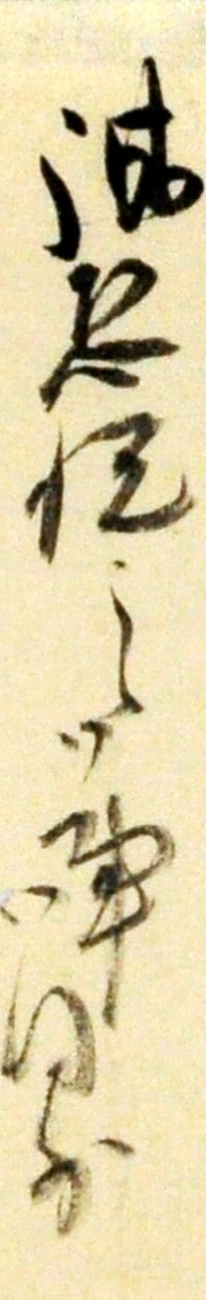誠恐悦之御事御同前
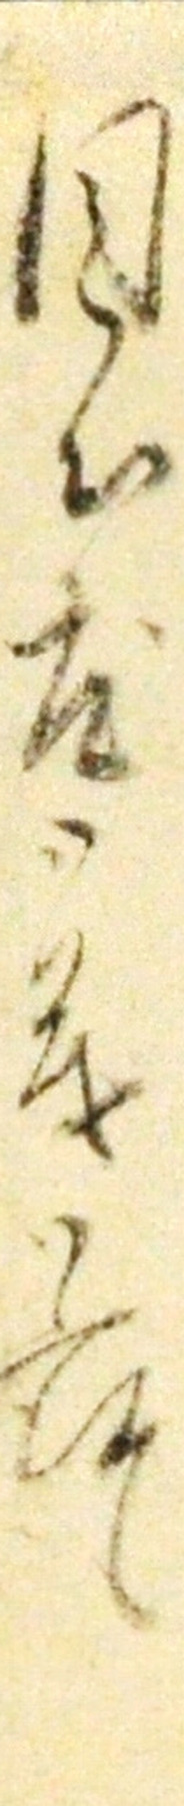目出度御儀御座候
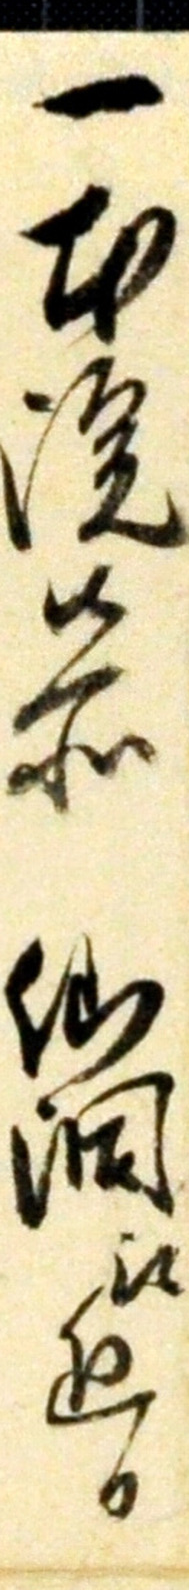一本院御所仙洞江近日
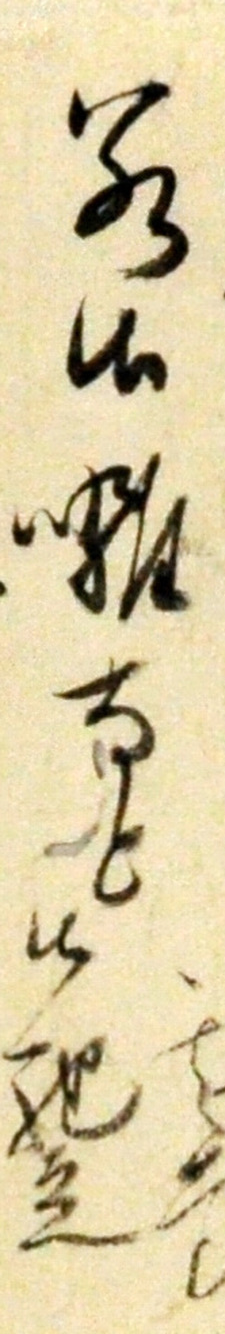若御囃なと御馳走
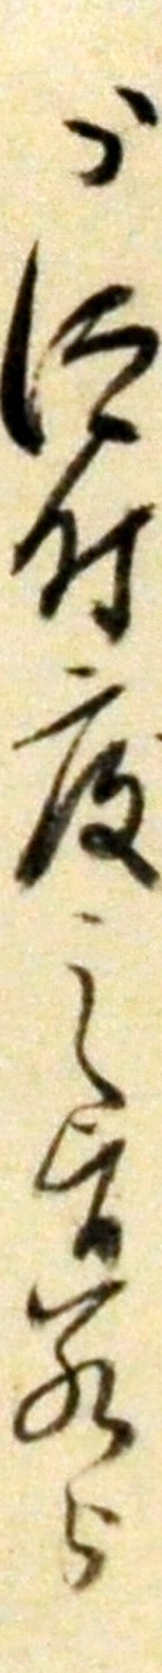被仰付度之旨若被
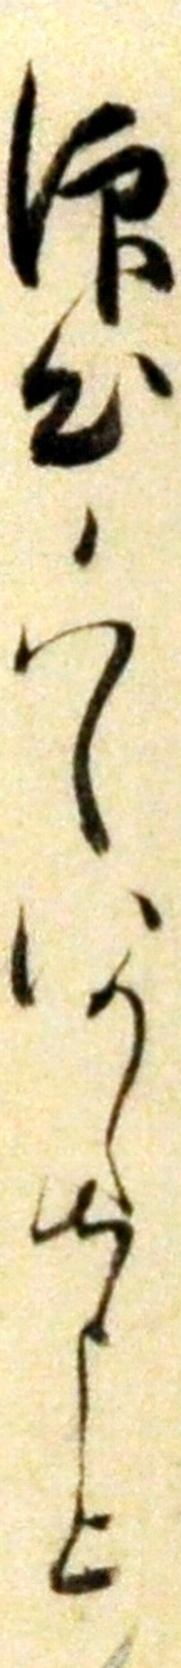仰出候はゝいかゝ御申上
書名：書状
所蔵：伊那市立高遠町図書館・合同会社AMANE
